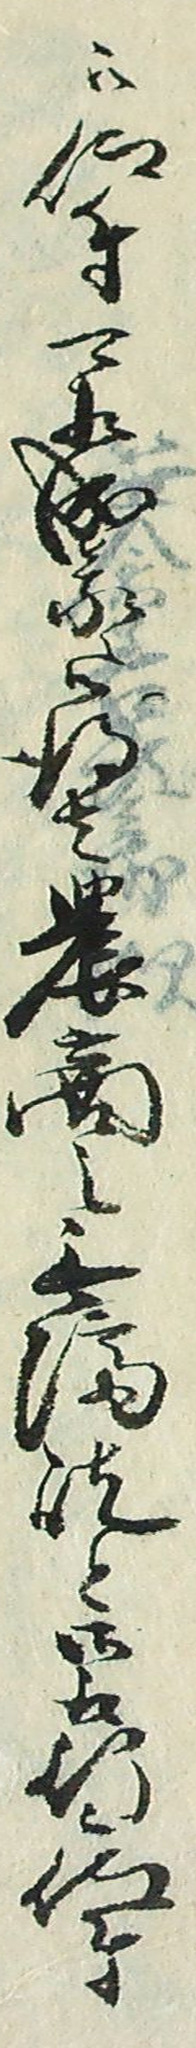被仰付可相成義に候得者農商之無隔屹と御取行被仰付
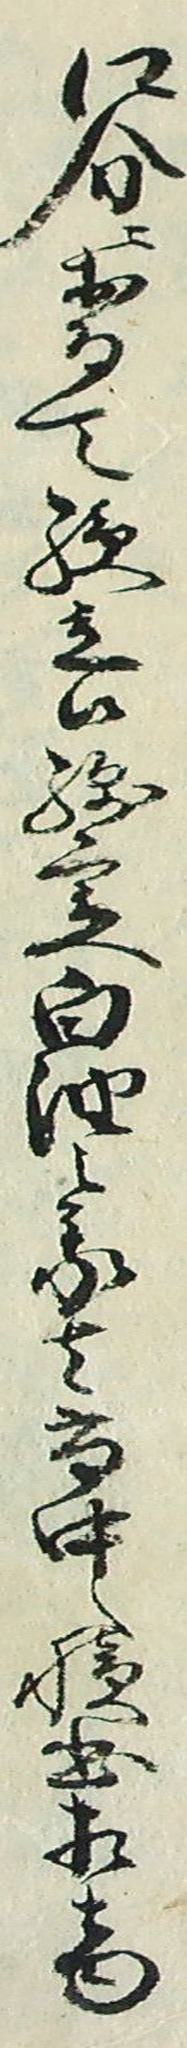郷分におゐて絞立候綿実白油之義者市中へ積出相商
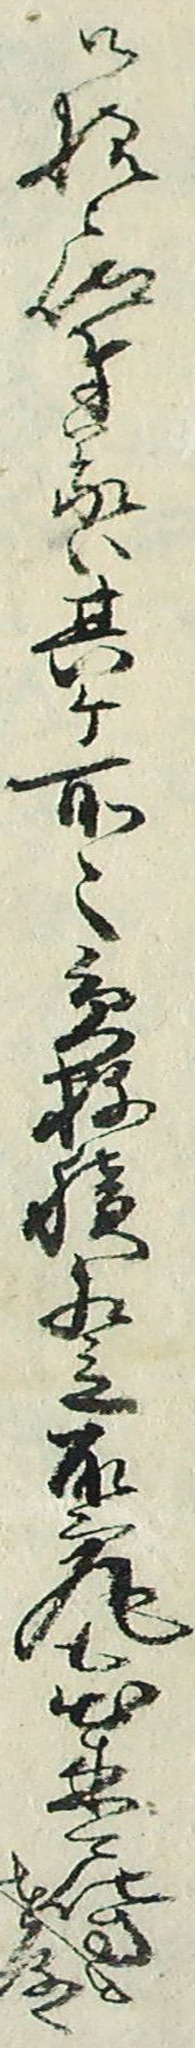候様被仰付義は其ケ所々員数積相立取究も出来可仕方と奉存候

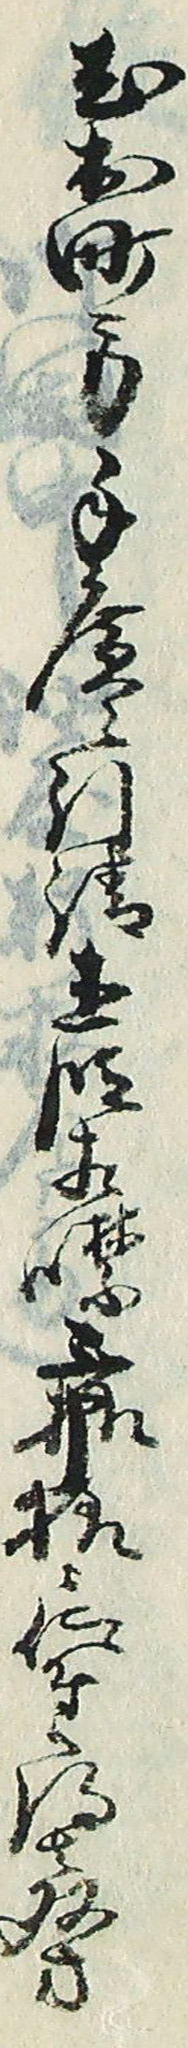尤於町方手広に引請直段相噤不申様被仰付候得者双方
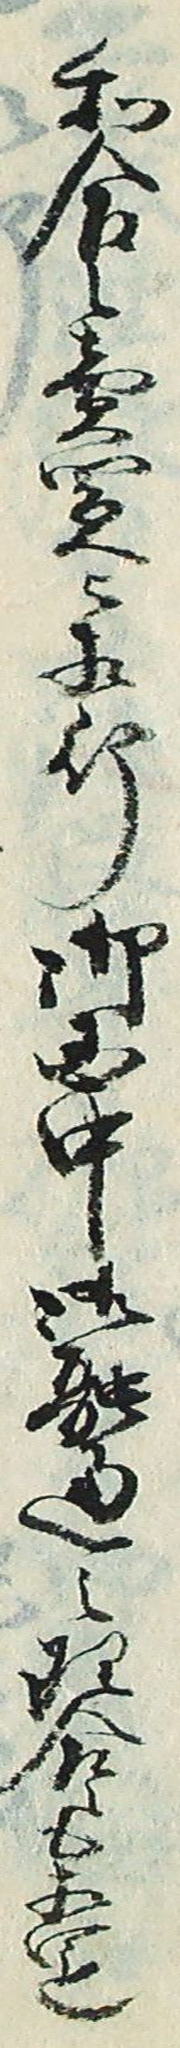和合之売買被相行御国中御融通之理合にも相運
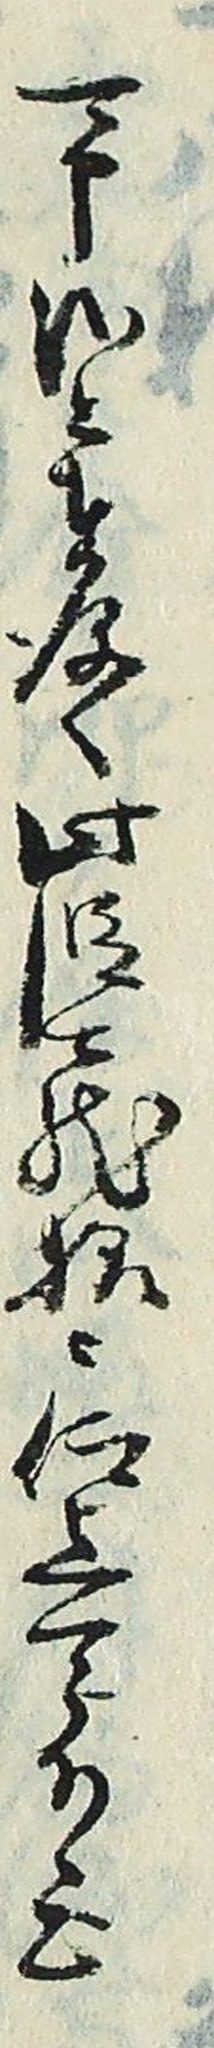可申哉と奉存候此段可然様被仰上可被下候以上
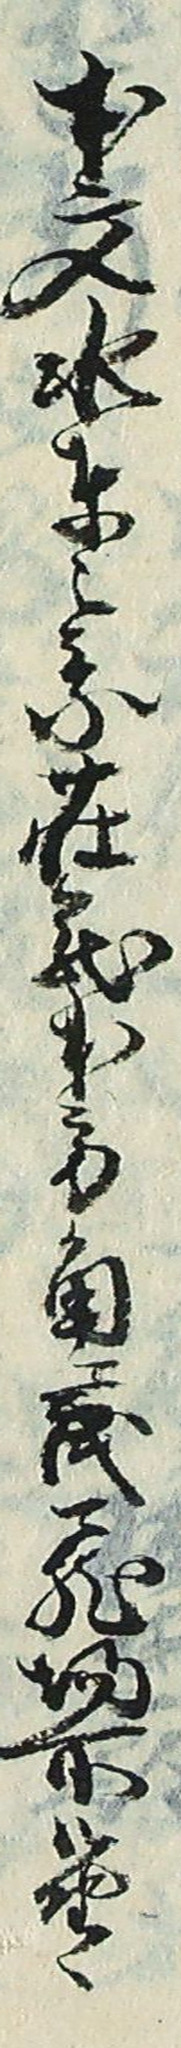本文水車之義荘蔵本方角にも可然場所御坐候
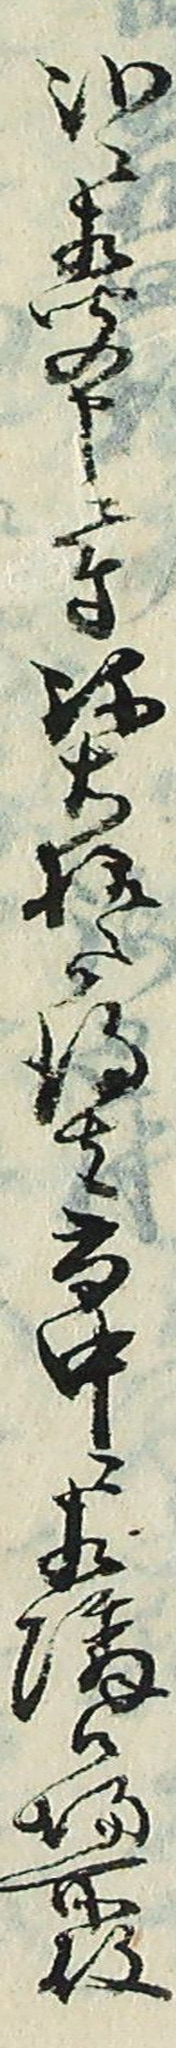哉に相聞申に付弥右様に候得者市中に相隣候場所故
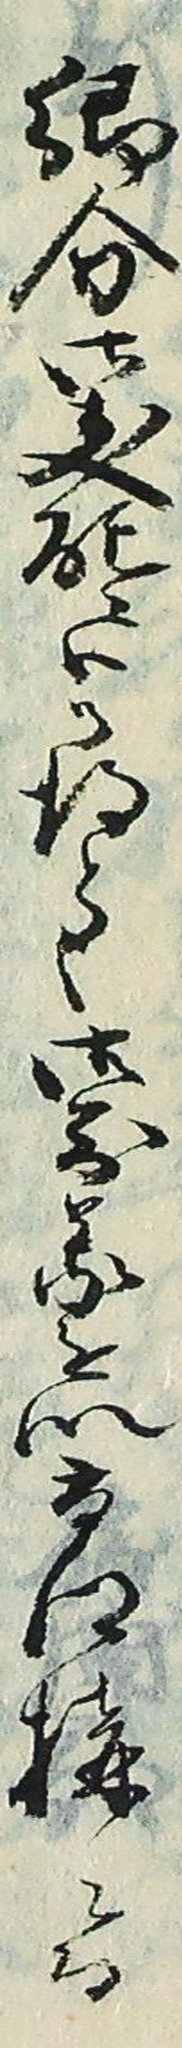郷分御支配には候得とも御別義を以市郷構二而
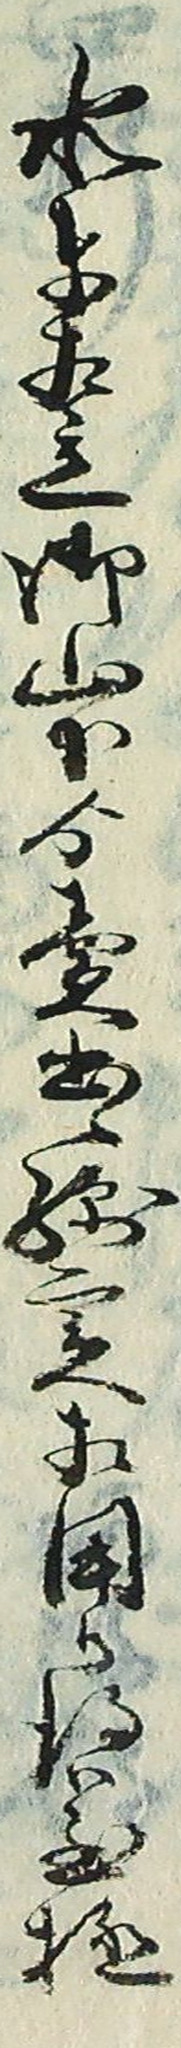水車相立御山下ゟ売出候綿実相用候得は至極
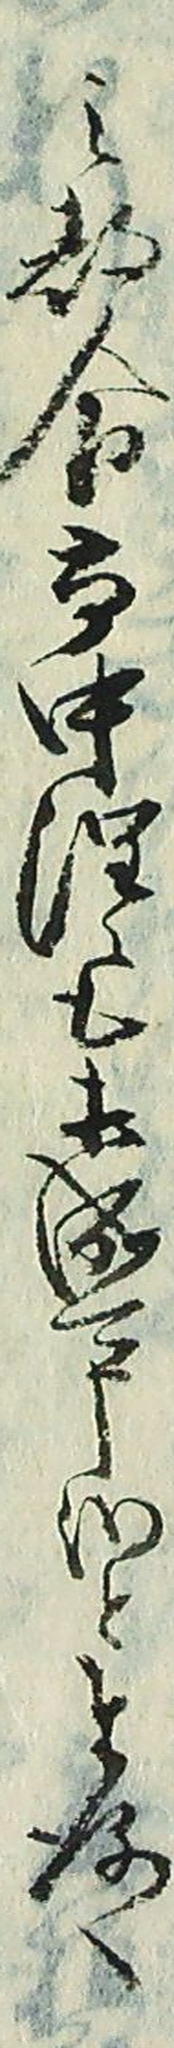之都合市中潤にも相成可申哉と奉存候
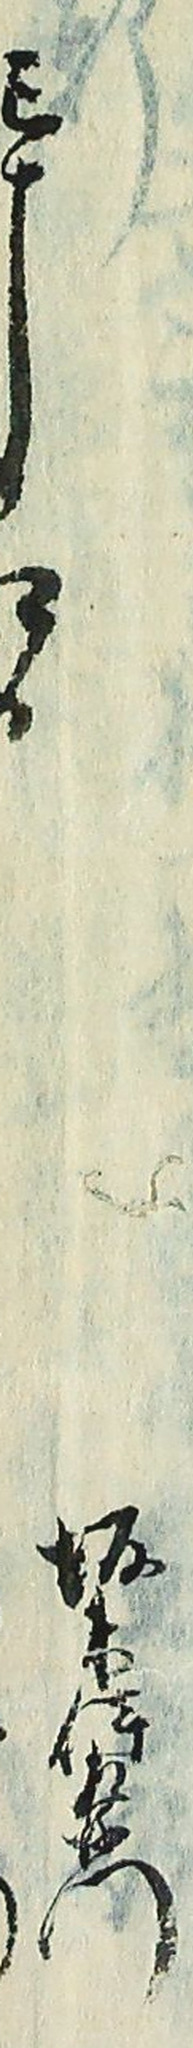巳十月四日坂東伊左衛門
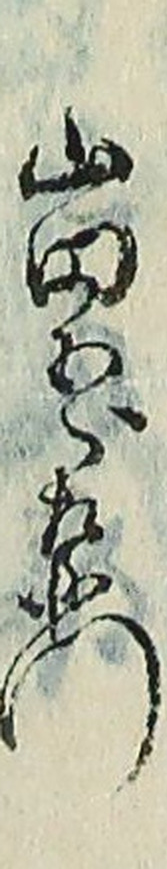山田五郎左衛門
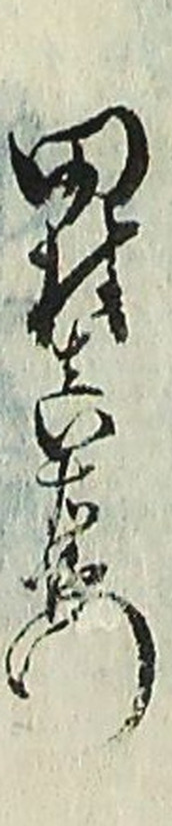田村真右衛門
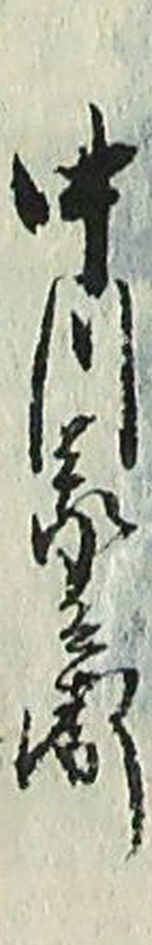中川義兵衛
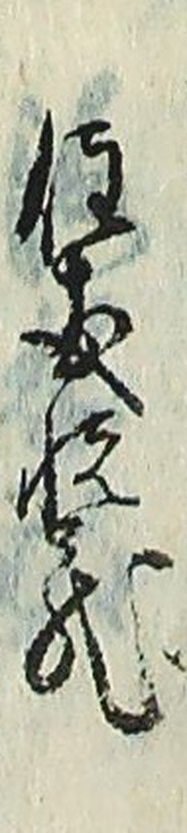住友悦蔵
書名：油稼御取究ニ附御箇條書テ以被仰渡南北同役申談御答書控
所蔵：鳴門教育大学 Naruto University of Education
